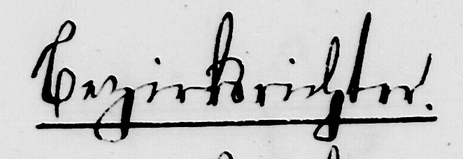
Bezirksrichter.
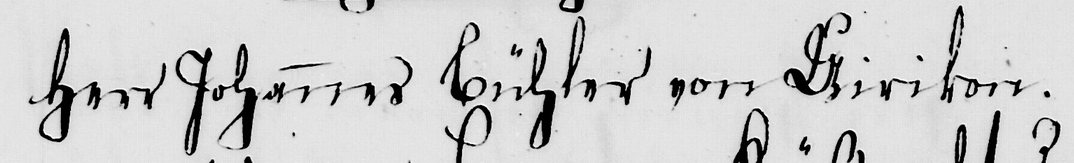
Herr Johannes Bühler von Uirikon.
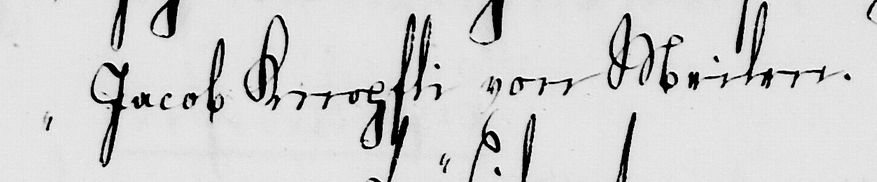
Jacob Knopfli von Meilen.
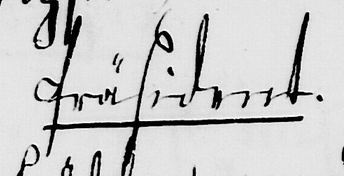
räsident.
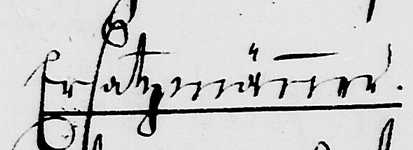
Ersatzmänner.
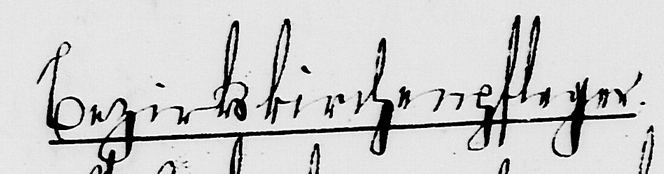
Bezirksschulpfleger.
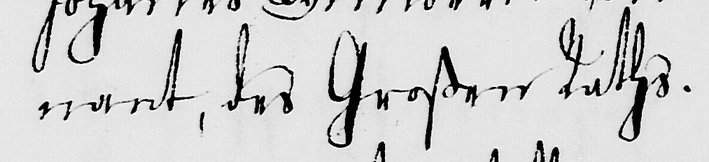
nant, des Großen Rathes.
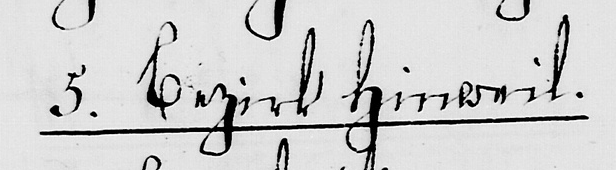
5. Bezirk Hinweil.
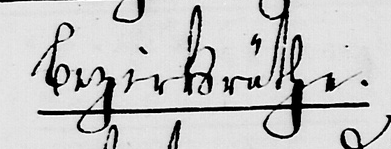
Bezirksräthe.
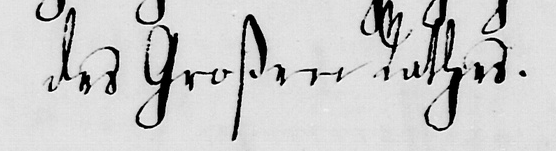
des Großen Rathes.
